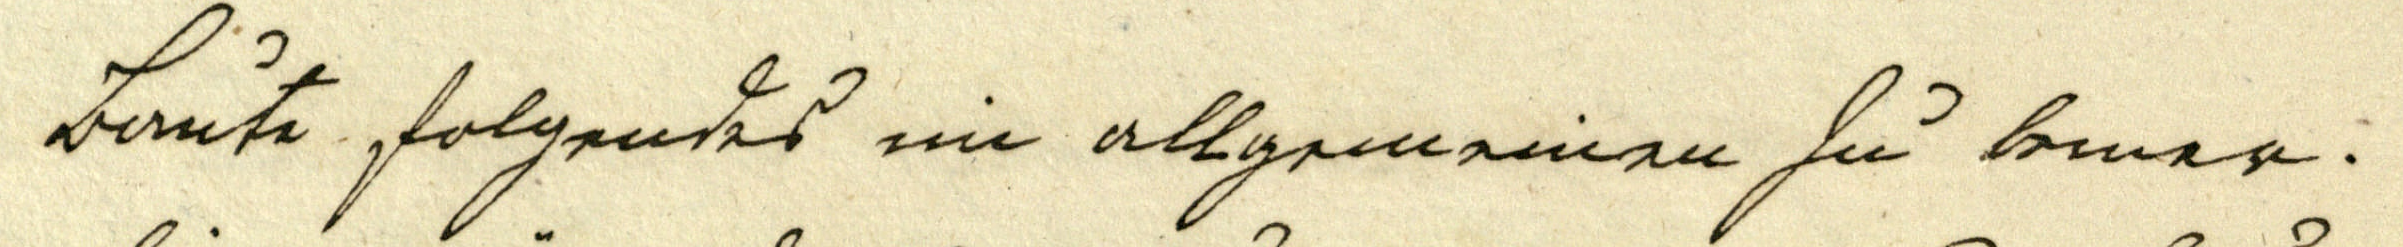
Baute folgendes im allgemeinen zu bemer¬
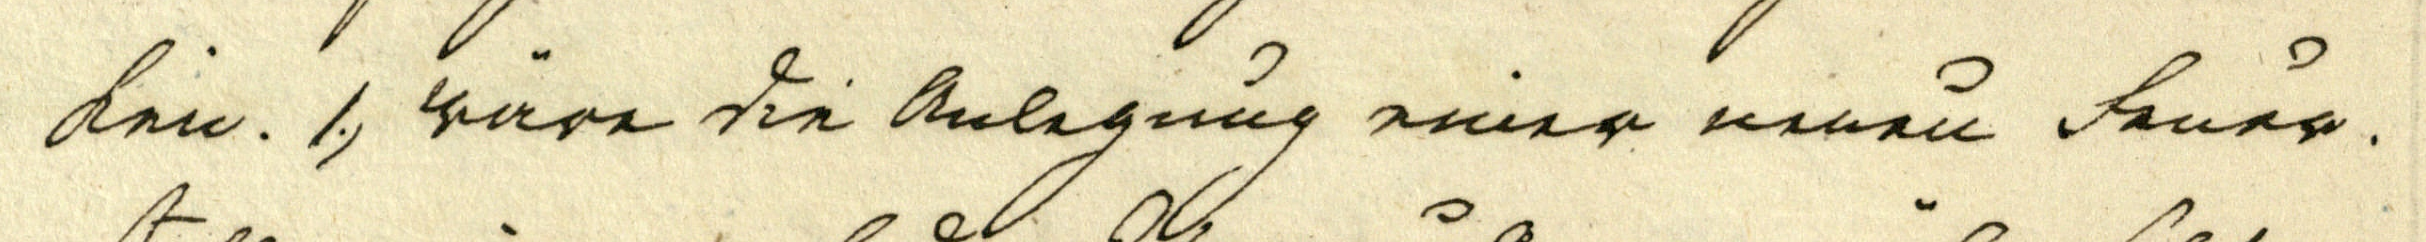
ken. 1., Wäre die Anlegung einer neuen Feuer¬
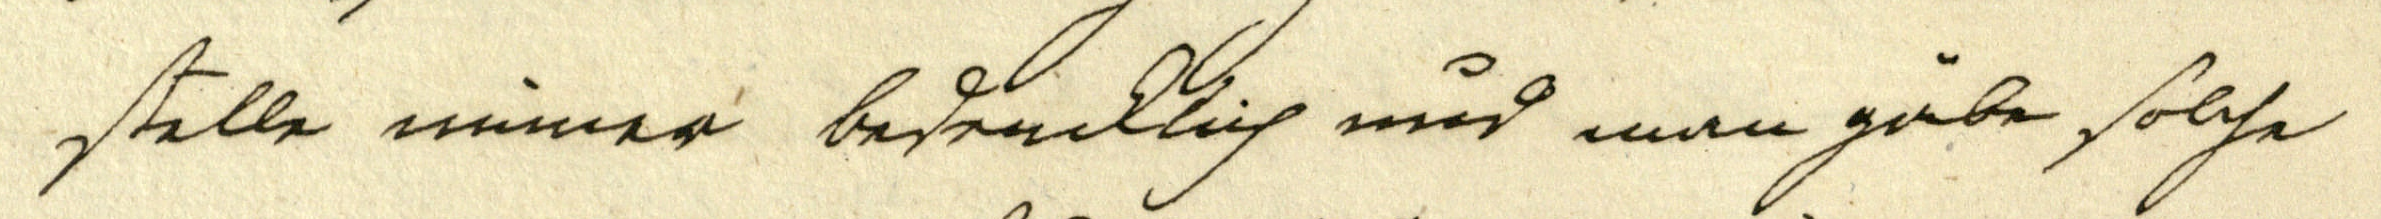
stelle immer bedencklich und man gäbe solche
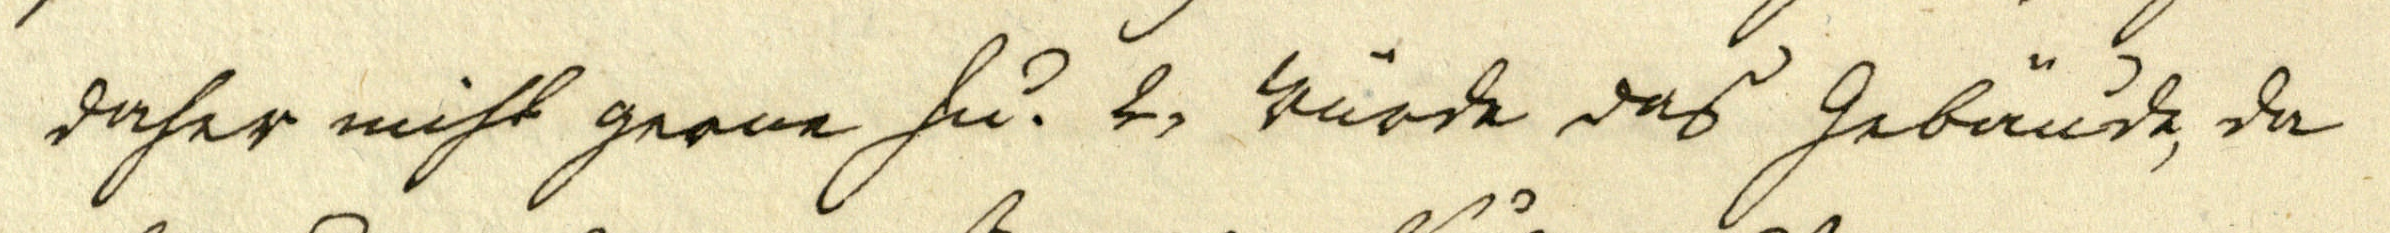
daher nicht gerne zu. 2., Würde das Gebäude, da
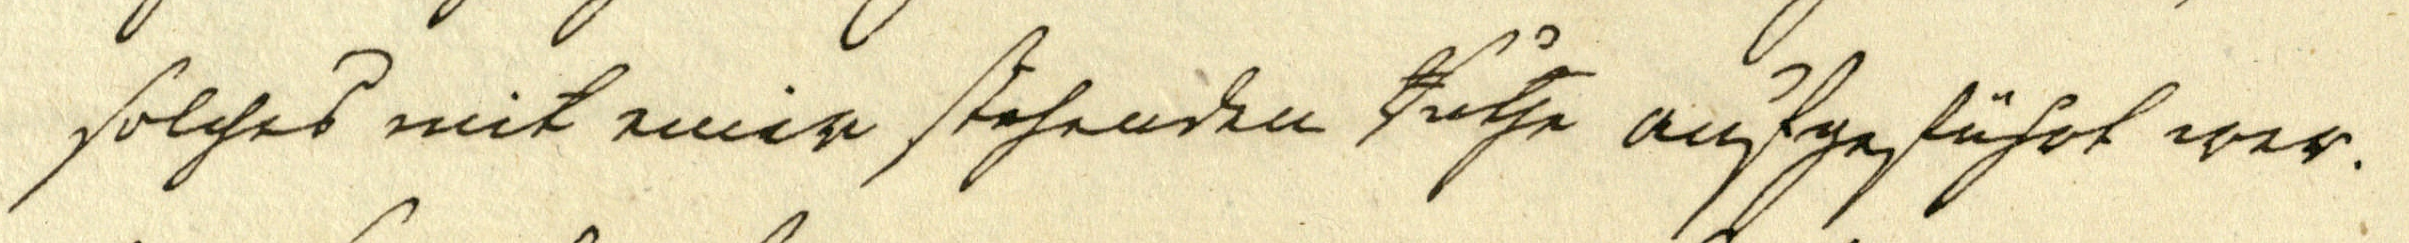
solches mit einer stehenden Ruthe aufgeführt wer¬
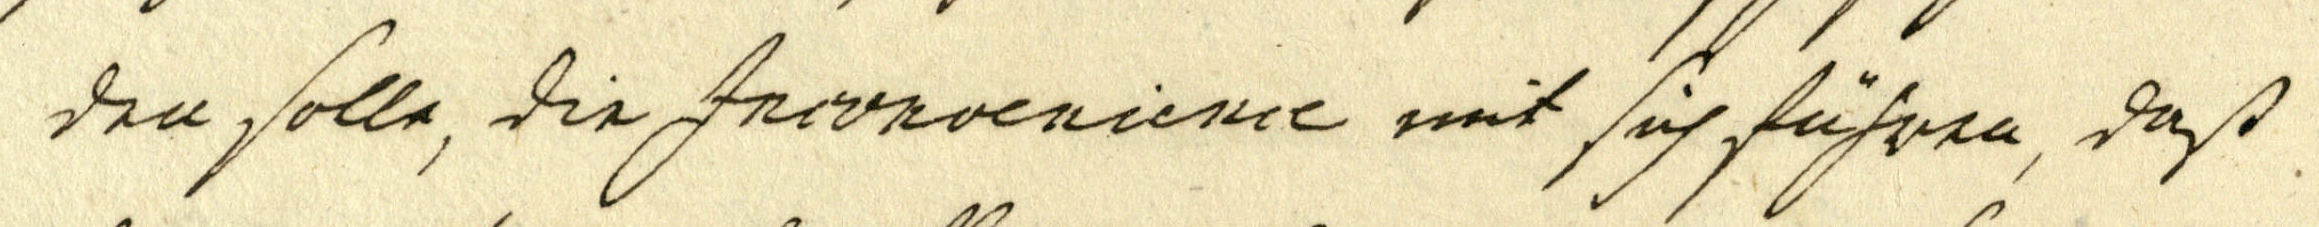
den solle, die Inconvenience mit sich führen, daß
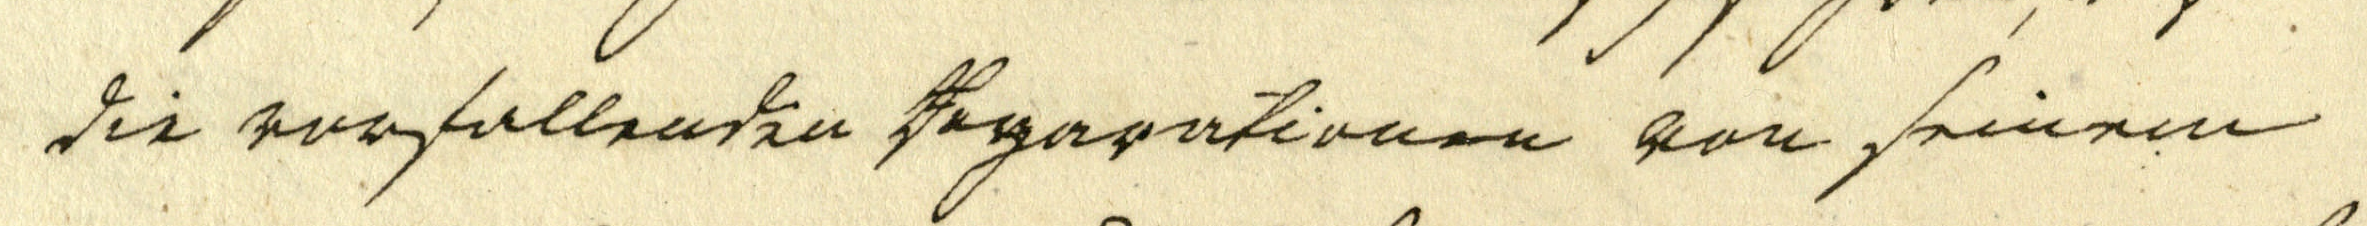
vorfallenden Reparationen von seinem
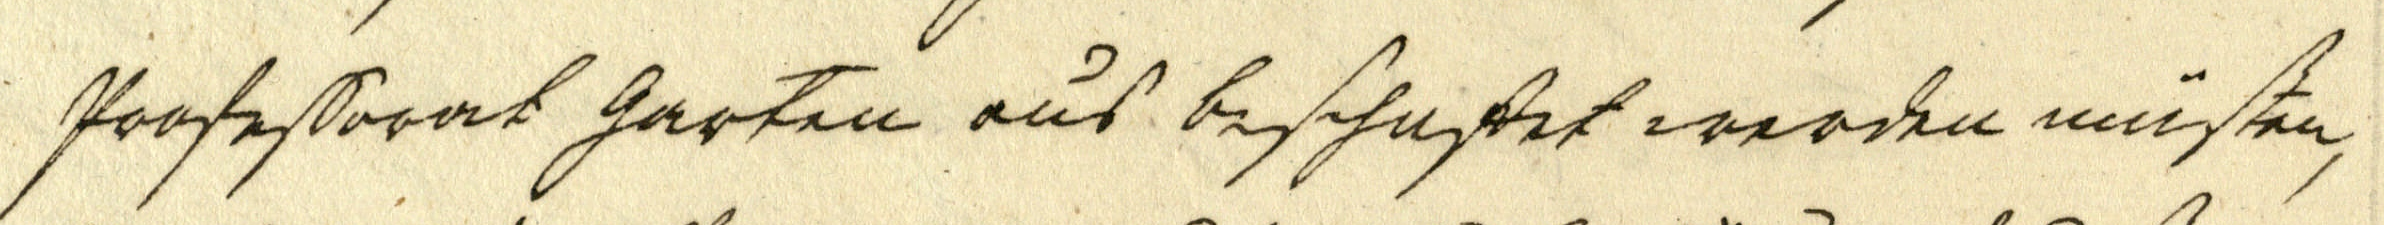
Professorat Garten aus beschafet werden müsten,
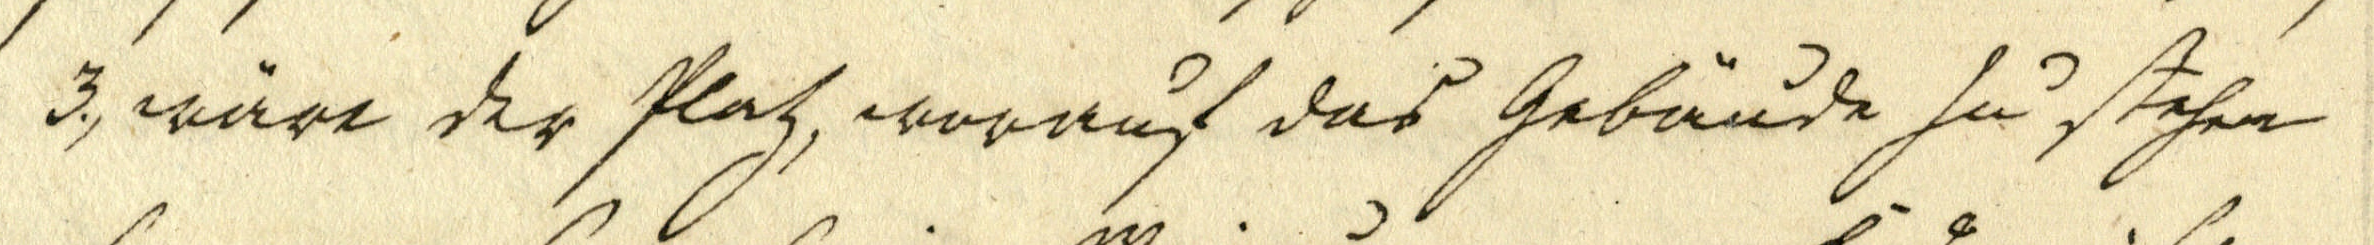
3. wäre der Platz, worauf das Gebäude zu stehen
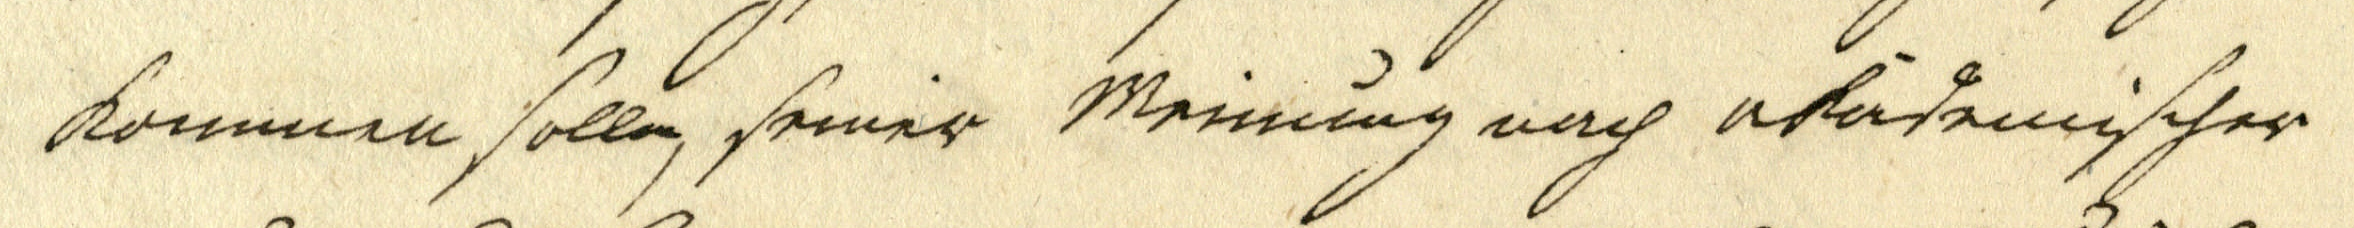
kommen solle, seiner Meinung nach akademischer
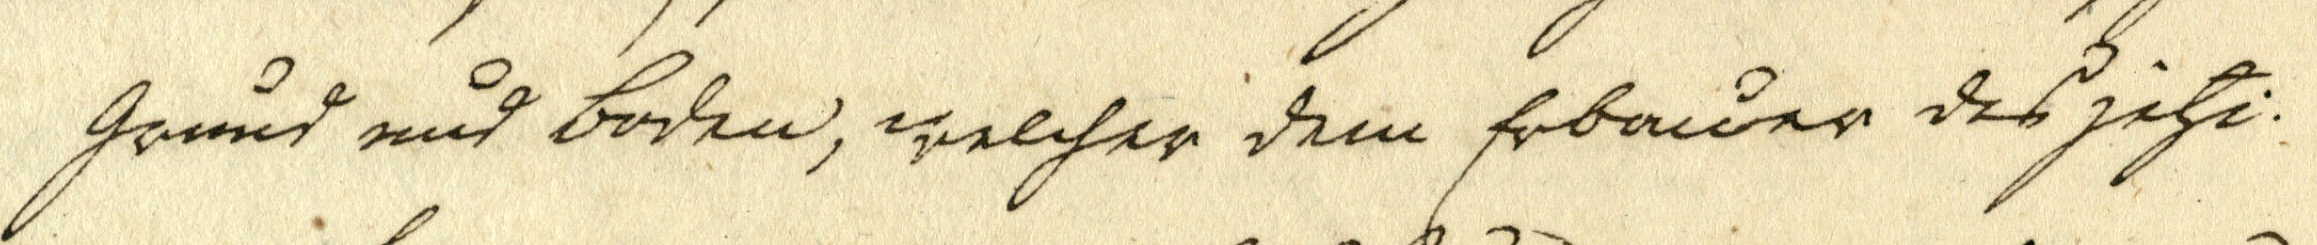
Grund und Boden, welcher dem Erbauer des jetzi¬
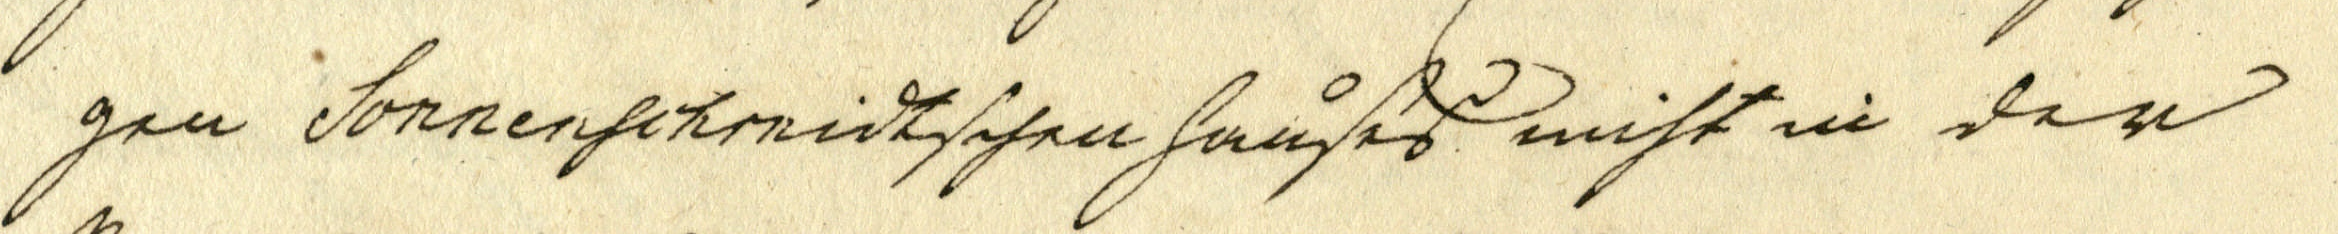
gen Sonnenschmidtschen Hauses nicht in der
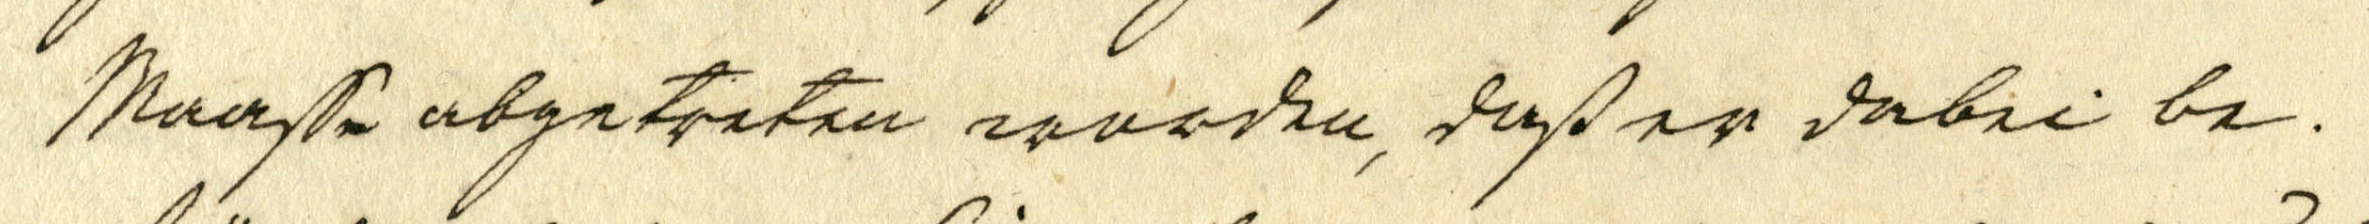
Maasse abgetreten worden, daß er dabei be¬
